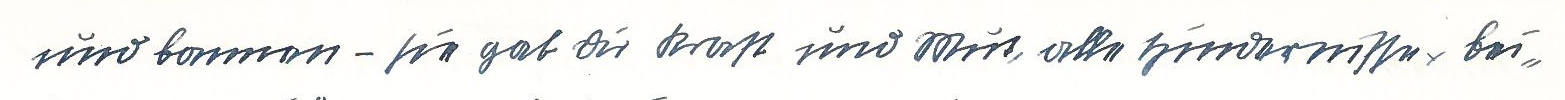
und bannen – sie gab Dir Kraft und Mut, alle Hindernisse bei¬
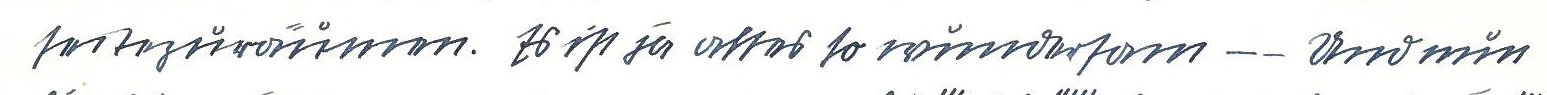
seitezuräumen. Es ist ja alles so wundersam – – Und nun
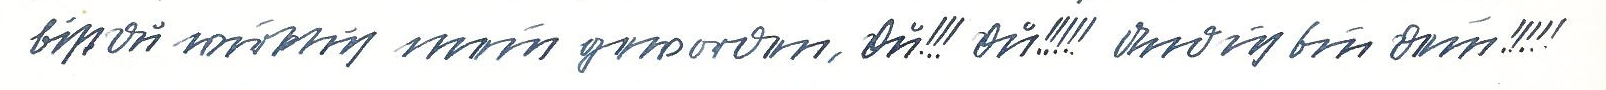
bist du wirklich mein geworden, Du!!! Du!!!!! Und ich bin Dein!!!!!
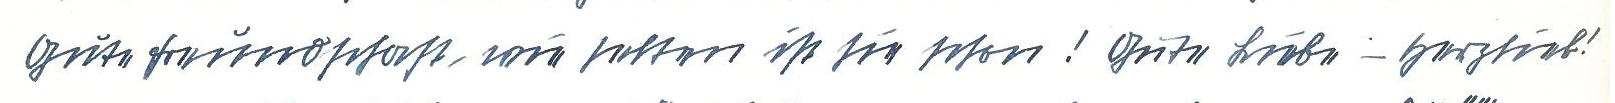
Gute Freundschaft, wie selten ist sie schon! Gute Liebe – Herzlieb!
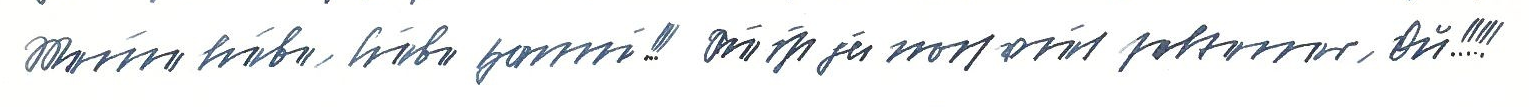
Meine liebe, liebe !!! Sie ist ja noch viel seltener, Du!!!!!
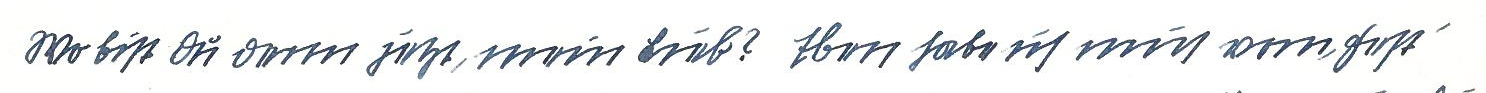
Wo bist Du denn jetzt, mein Lieb? Eben hab ich mich vom Fest
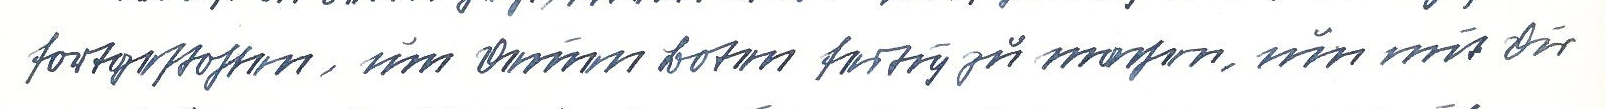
fortgestohlen, um Deinen Boten fertig zu machen, um mit Dir
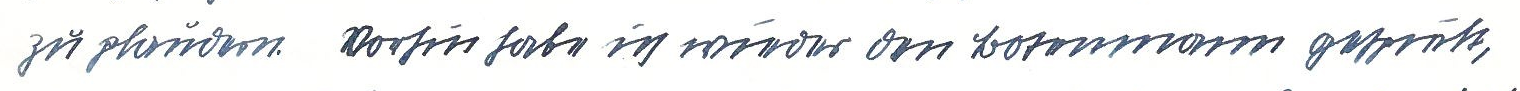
zu plaudern. Vorhin hab ich wieder den Botenmann gespielt,
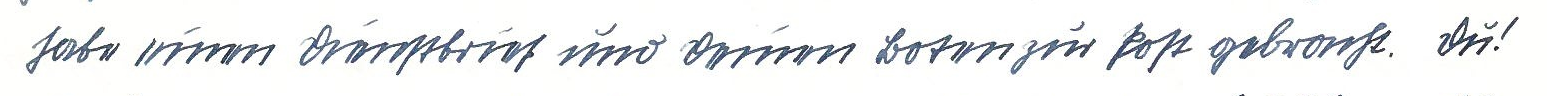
habe einen Dienstbrief und Deinen Boten zur Post gebracht. Du!
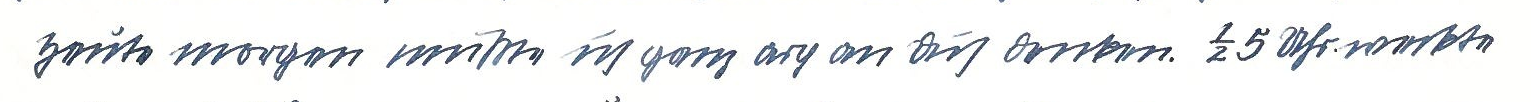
Heute morgen mußte ich ganz arg an dich denken. ½ 5 Uhr weckte
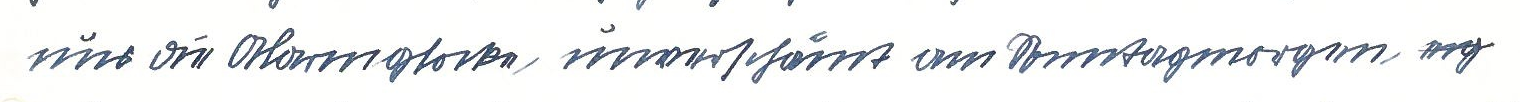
uns die Alarmglocke, unverschämt am Sonntagmorgen,
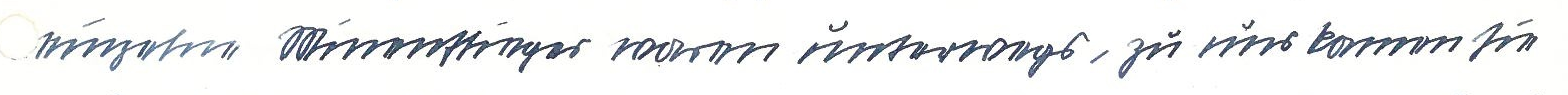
einzelne Minenflieger waren unterwegs, zu uns kamen sie
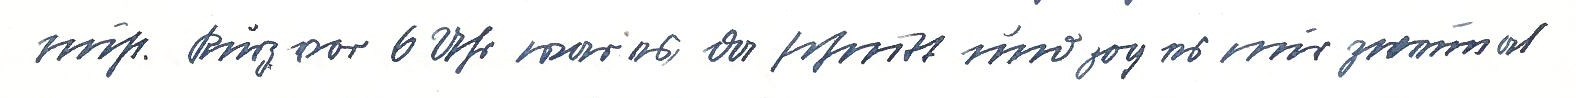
nicht. Kurz vor 6 war es, da schnitt und zog es mir zweimal
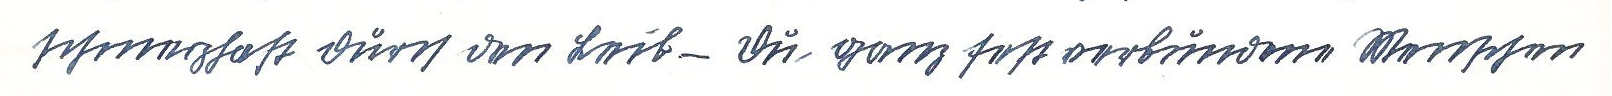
schmerzhaft durch den Leib – Du, ganz fest verbundene Menschen
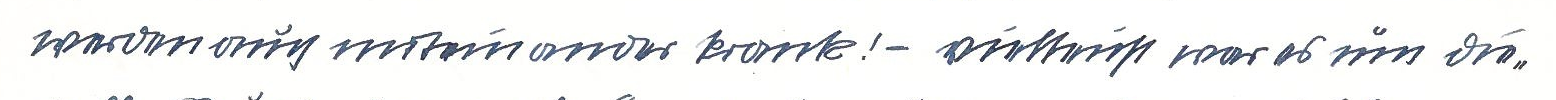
werden auch miteinander krank! – vielleicht war es um die¬
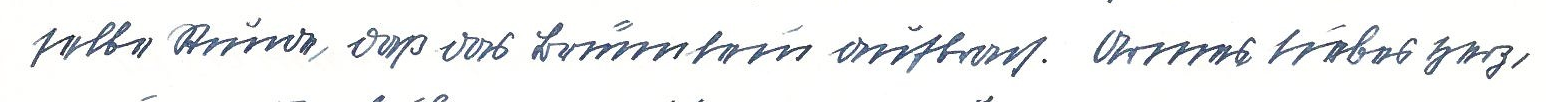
selbe Stunde, daß das Brünnlein aufbrach. Armes liebes Herz,
